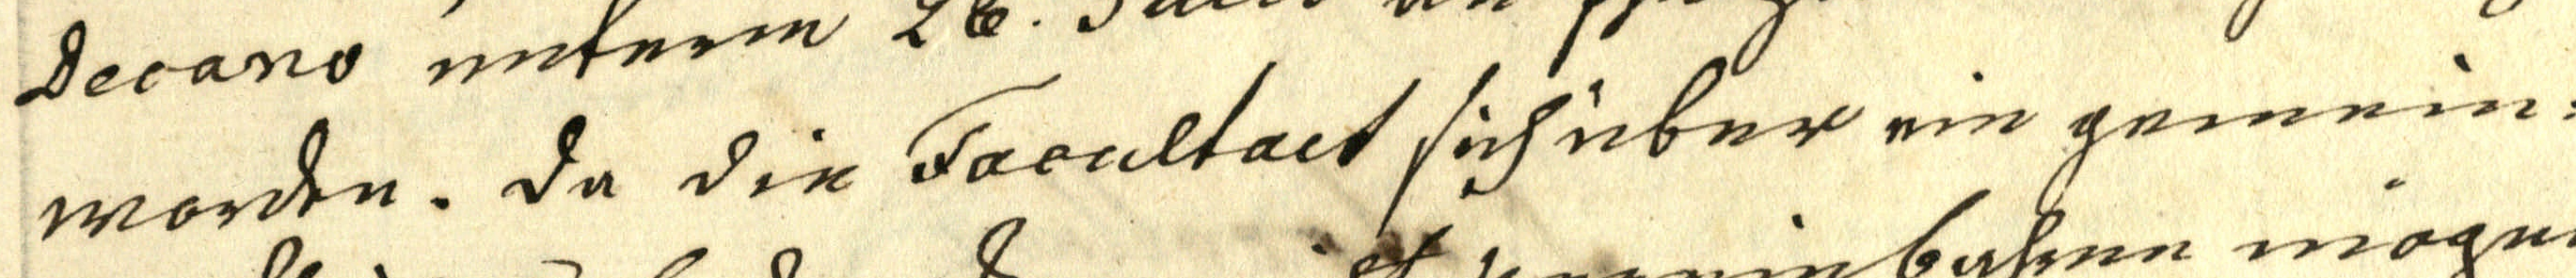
worden. Da die Facultaet sich über ein gemein¬
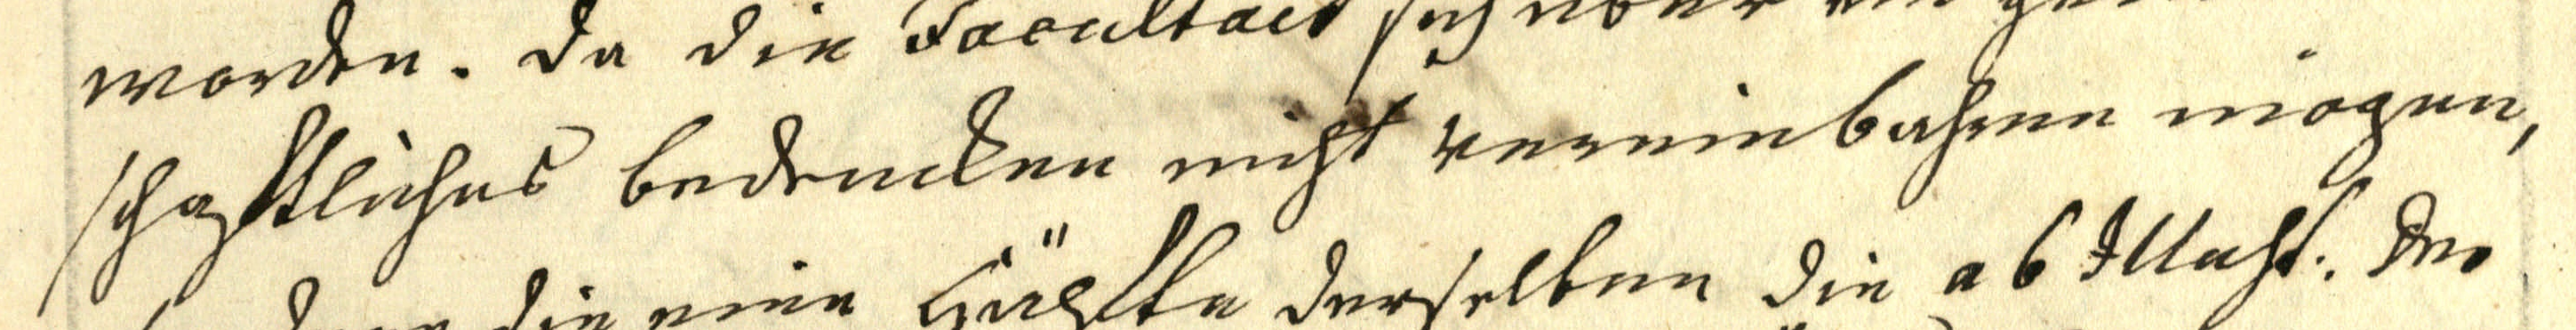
schaftliches Bedencken nicht vereinbahren mögen,
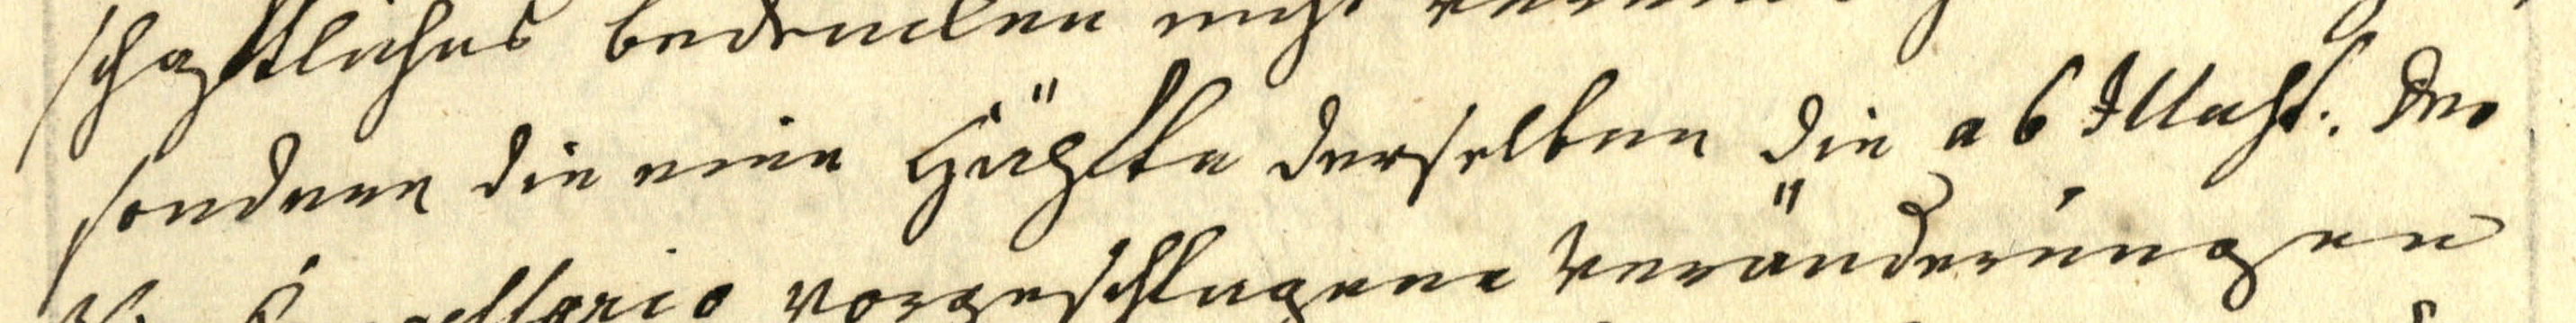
sondern die eine Hälfte derselben die a 6 Illust. Pflicht. Dno
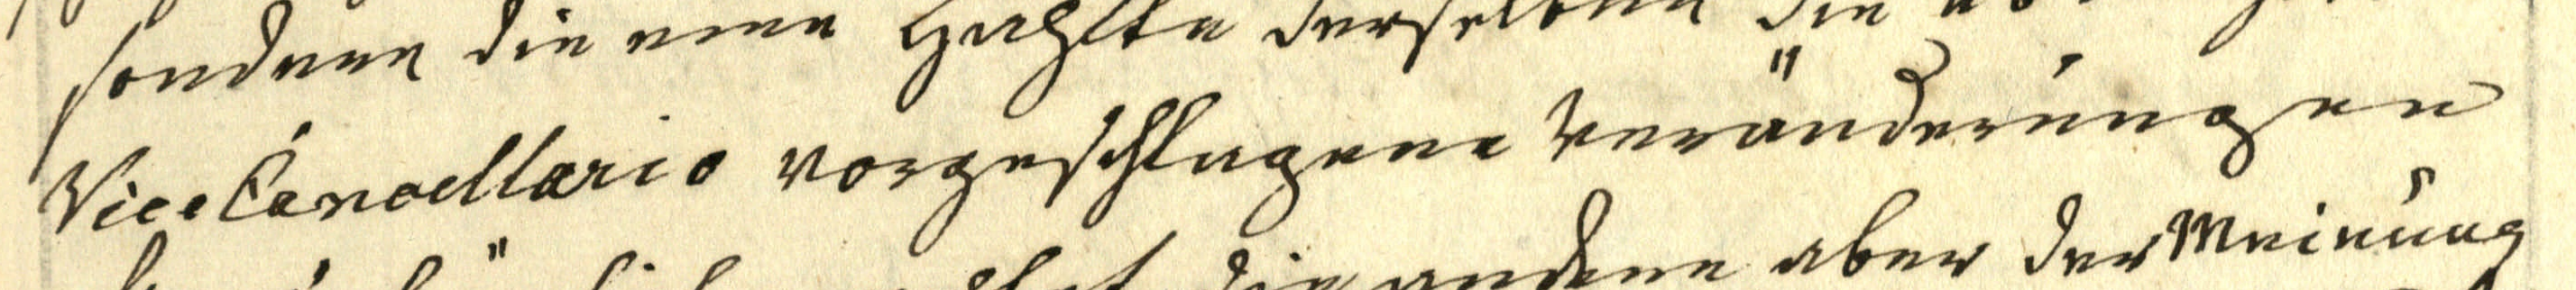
Vice Cancellario vorgeschlagene Veränderungen
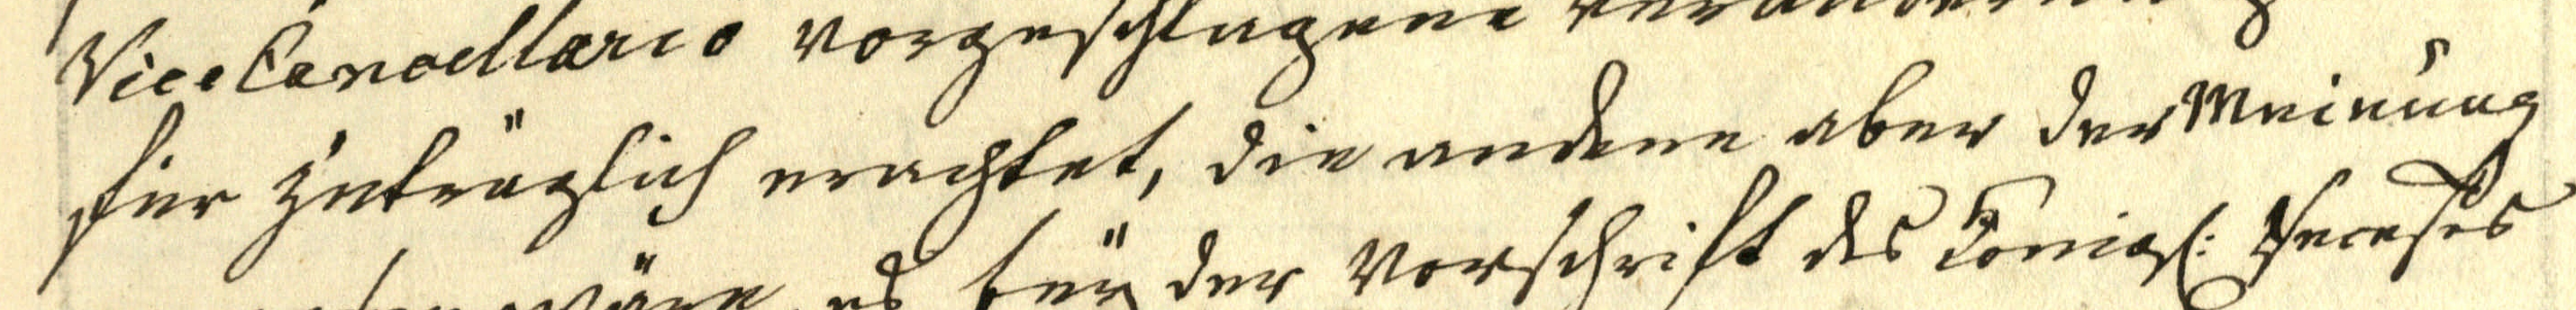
für zuträglich erachtet, die andern aber der Meinung
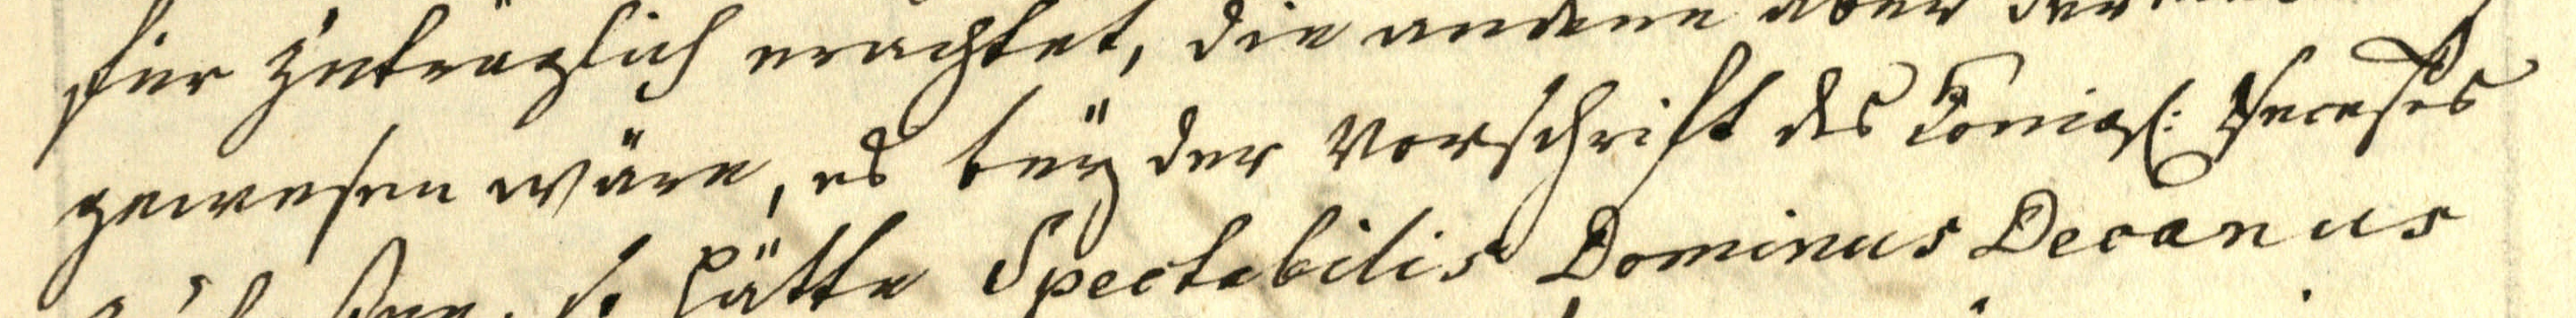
gewesen wäre, es beÿ der Vorschrift des Königl Receßes
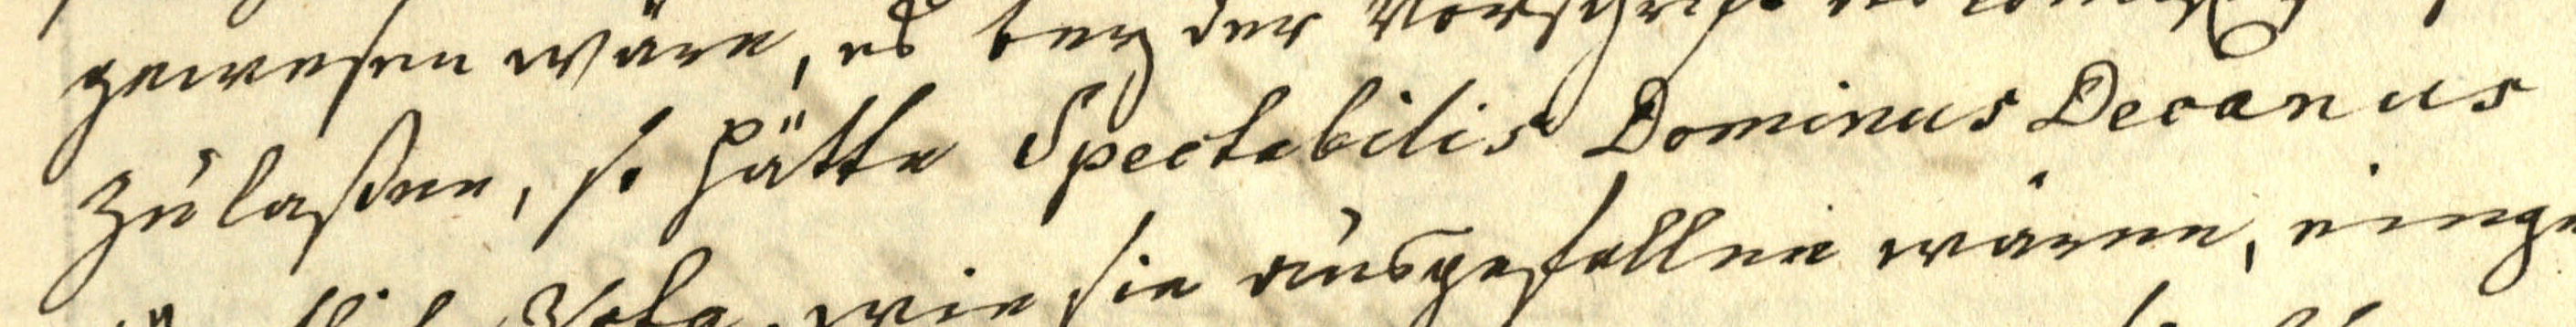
zu laßen, so hätte Spectabilis Dominus Decanus
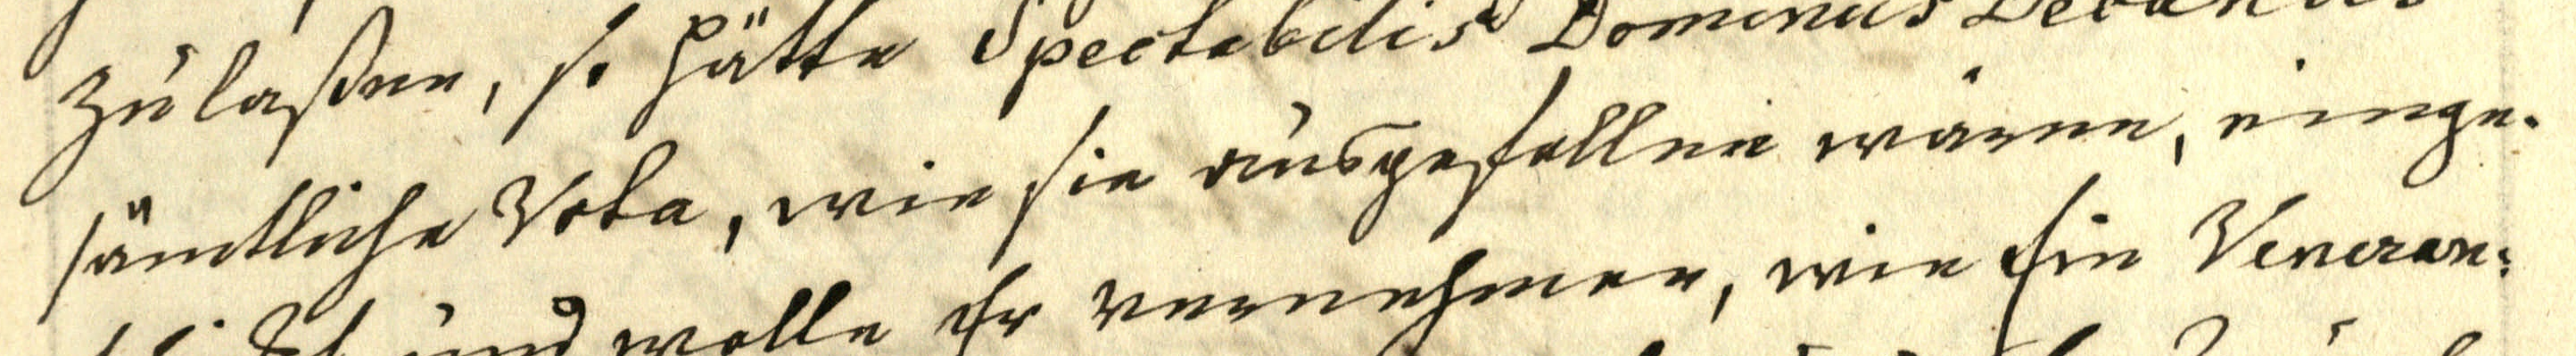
sämtliche Vota, wie sie ausgefallen wären, einige¬
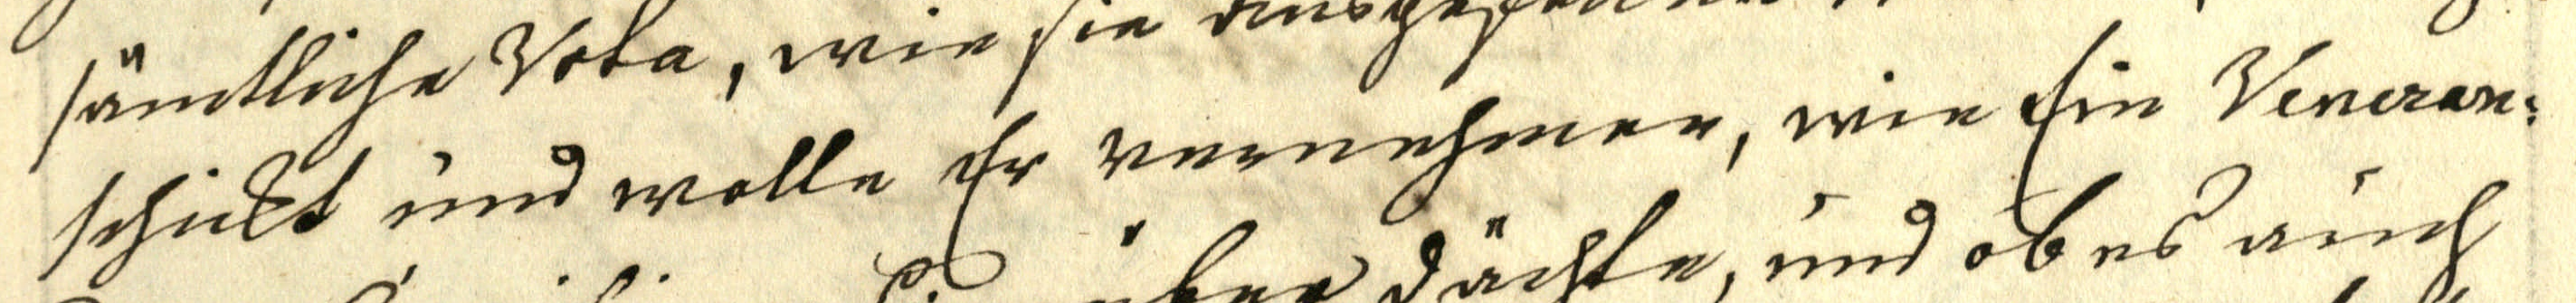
schickt und wolle Er vernehmen, wie Ein Venerand¬
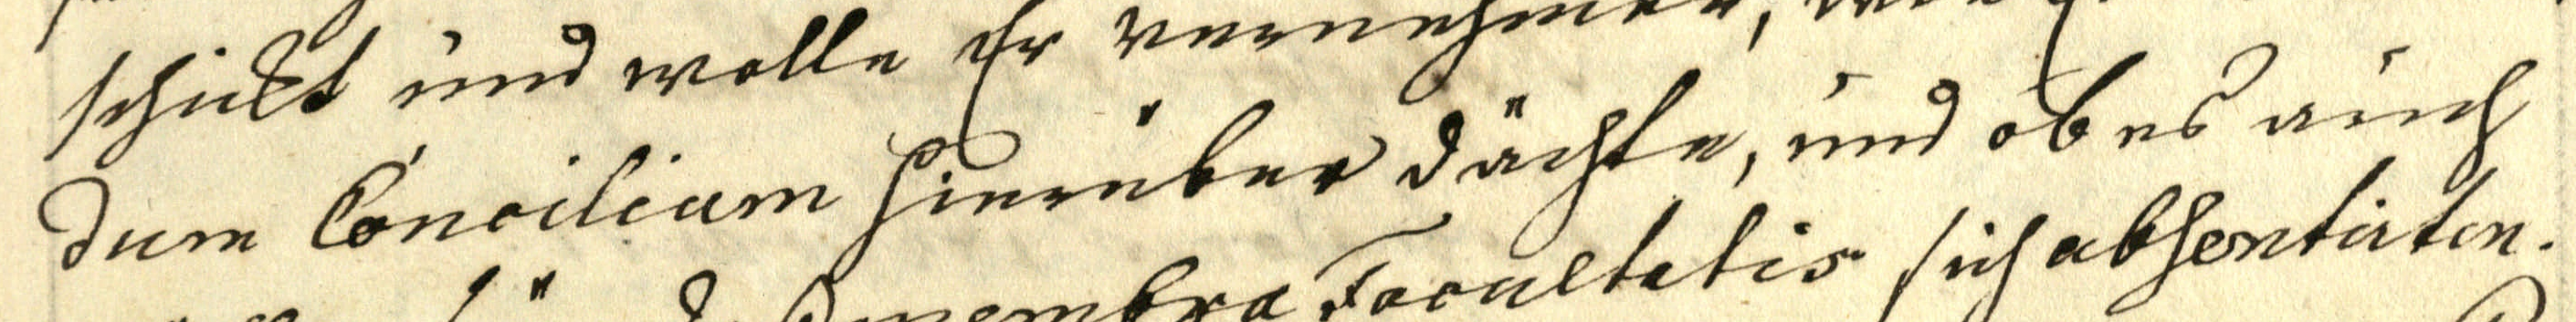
dum Concilium hierüber dächte, und ob es auch
